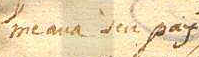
meaua seu pay
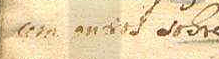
com outros sobre
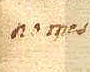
nomes
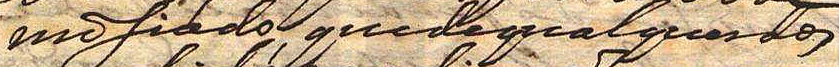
nūsiado, que de qualquer dos
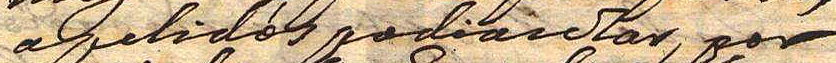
apelidos podia uzar, por
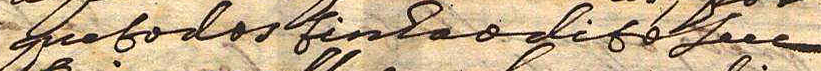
que todos tinha o dito seu
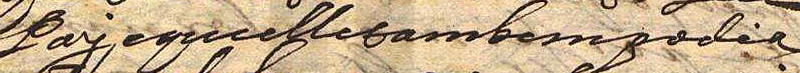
Pay, e que elle tambem podia
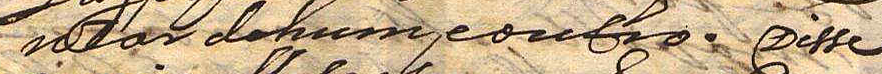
uzar de hum, e outro. Disse
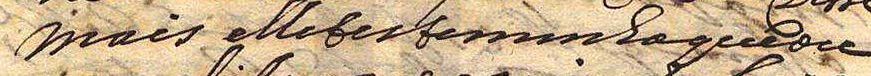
mais elle testemunha que ou
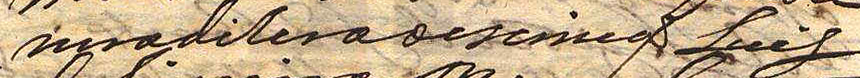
uira dizera o escriuaõ Luis
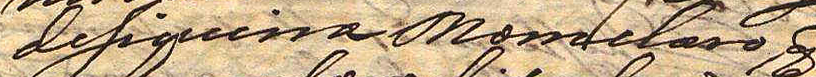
de Siqueira Momclaro, q̄
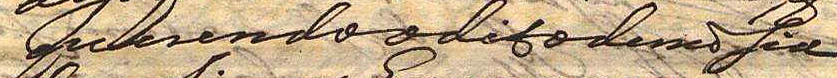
querendo o dito denūssia
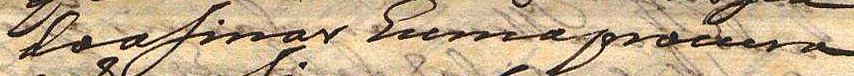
do asinar huma procura
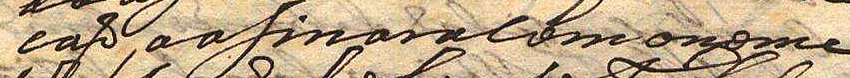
çaõ, a asinara com o nome
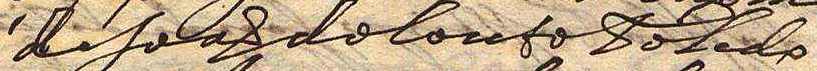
de Joaõ do Couto Toledo,
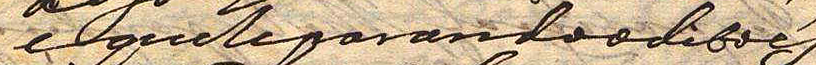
e que reparando o dito es
